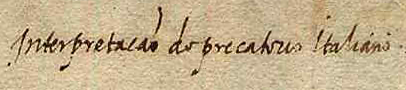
Jnterpretaçaõ do precatorio Italiano.
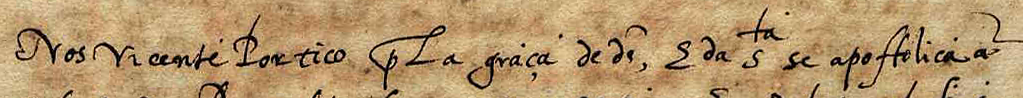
Nos Vicente Portico p̄La graça de ds̄, E da Sta se apostolica ar
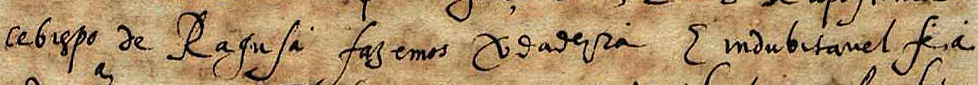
cebispo de Ragusa fazemos ꝟdadejra E indubitauel fe a
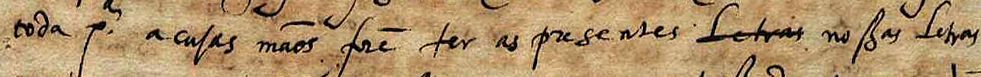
toda p.a a cujas mãos forē ter as presentes Letras nossas Letras
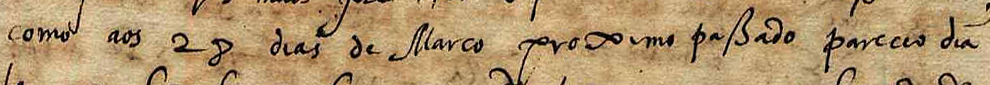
como aos 28 dias de Marco proximo passado pareceo diā
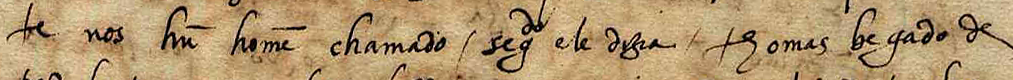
te nos hū homē chamado / segdo ele dizia / thomas begado de
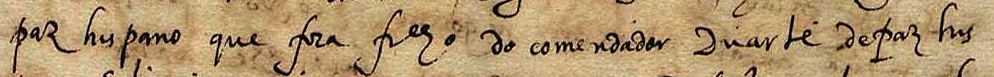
paz hispano que fora filho do comendador Duarte de paz his
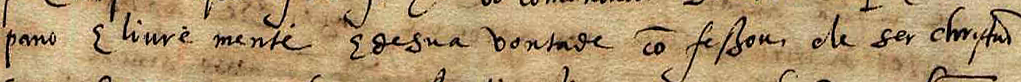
pano E liuremente E de sua vontade cōfessou ele ser christaõ
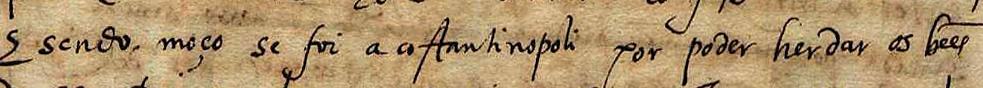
E sendo moço se foi a costantinopoli por poder herdar os bēes
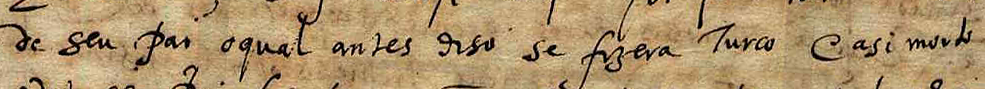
de seu pai o qual antes diso se fizera Turco e asi morto
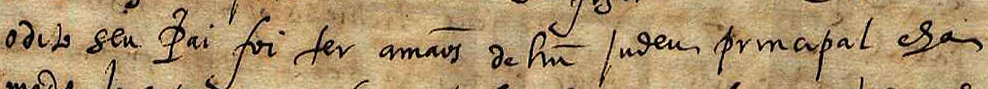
o dito seu Pai foi ter a mãos de hū Judeu principal cha
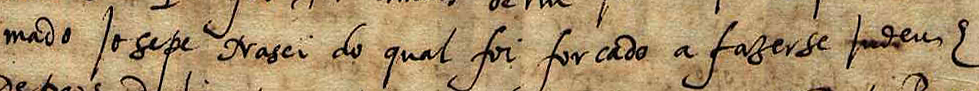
mado Josepe Nasei do qual foi forcado a fazerse Judeu E
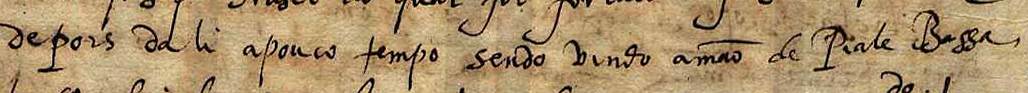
depois dali a pouco tempo sendo vindo a mão de Piale Bassa
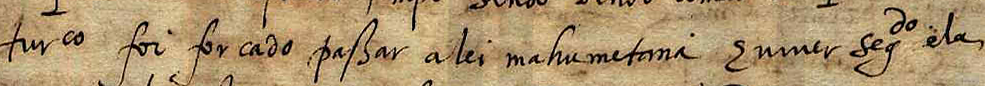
turco foi forcado passar a lei mahumetana E uiuer segdo ela
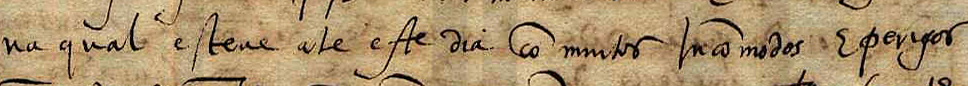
na qual esteue ate este dia cō muitos Jncōmodos E perigos
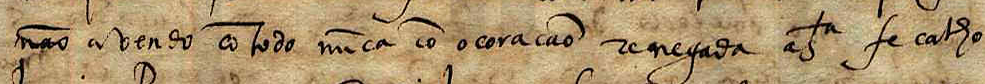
não avendo c̄otodo nūca cō o coracão renegada a sta fe catho
